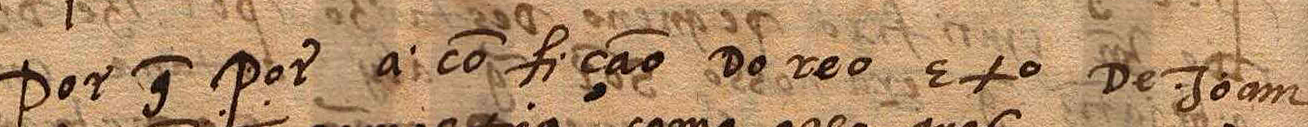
Porq̄ por a cōfição do reo E to de Joam
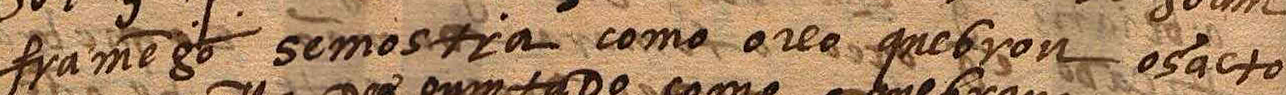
framēgo se mostra como o reo quebrou o sācto
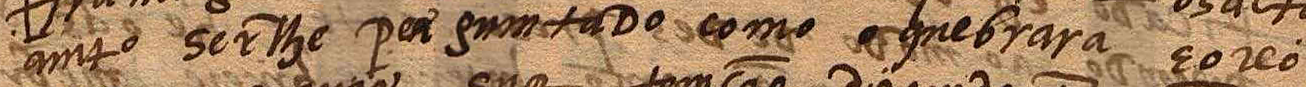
amto ser lhe pergumtado como o quebrara E o reo
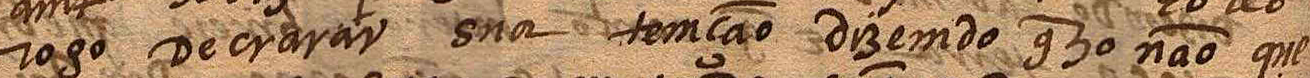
logo decrarar sua temção dizemdo q̄ ho não que
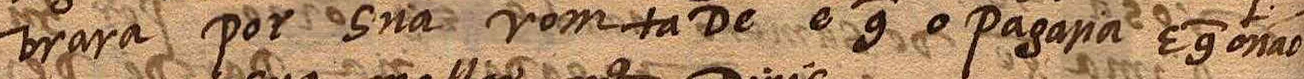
brara por sua vomtade e q̄ o pagaria E q̄ o não
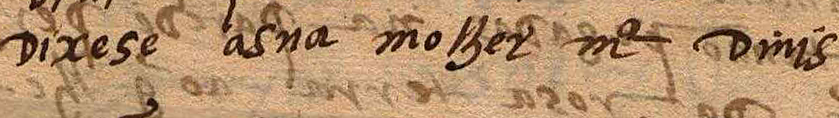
dixese a sua molher ma dinis
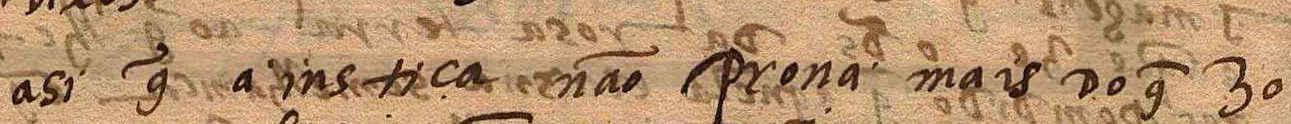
asi q̄ a iustiça não proua mais do q̄ ho
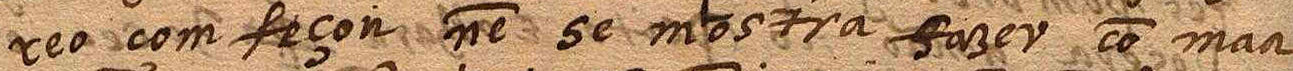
reo comfeçou n̄e se mostra fazer c̄o maa
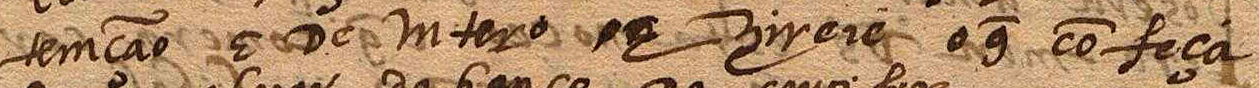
temção E de lutero E hireie o q̄ c̄ofeça
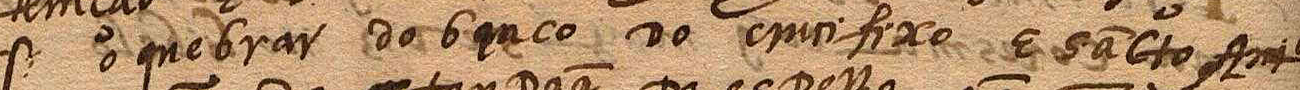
.s. o quebrar do brnco do crucifixo E sācto Anto
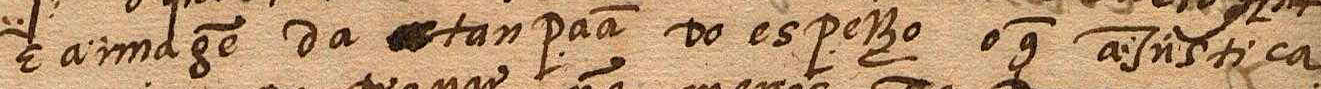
E a imagē da tanpaā do espelho o q̄ a Justiça
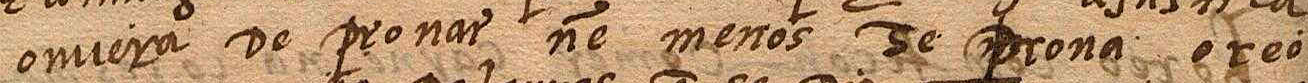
ouuera de prouar nē menos se proua o reo
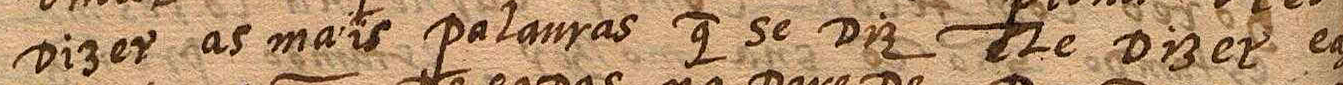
dizer as mais palauras q̄ se diz ele dizer e as
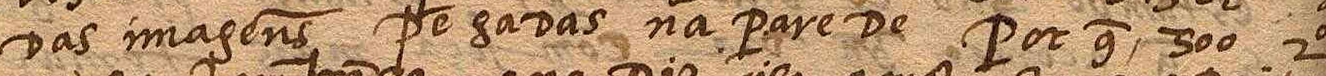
das imagen̄s pegadas na parede porq̄ soo 2o
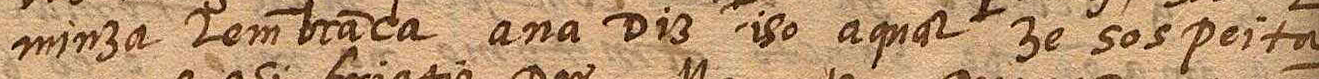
minha Lembrāça ana diz iso a qual he sospeita
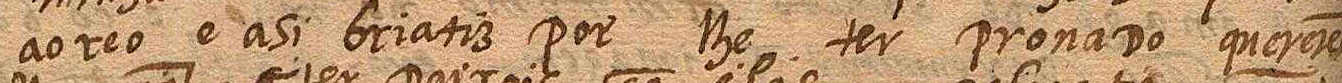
ao reo e asi briatiz por lhe ter prouado quererē
